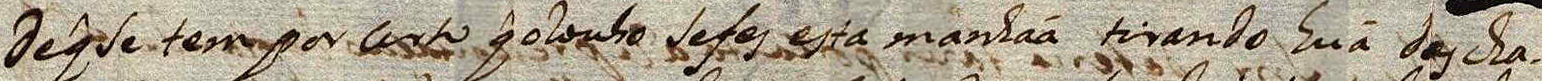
de q̄ se tem por certo q̄ o Roubo se fes esta manhaã tirando huā das cha
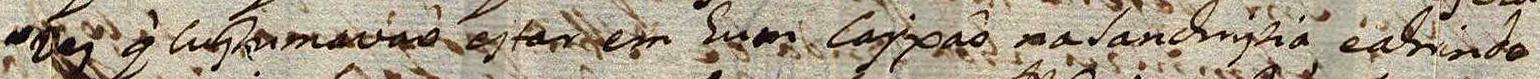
ves q̄ custumavaõ estar em hum cayxaõ na sanchristia, e abrindo
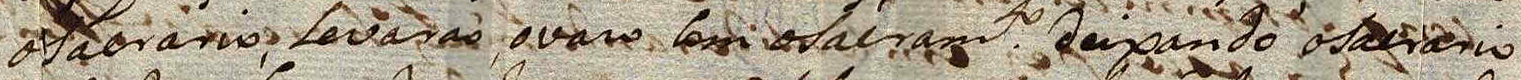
o sacrario, Levarao o vazo com o sacram.to deixando o sacrario
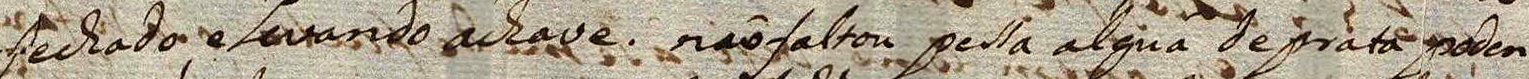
fechado, e levando a chave. naõ faltou pessa alguā de prata poden
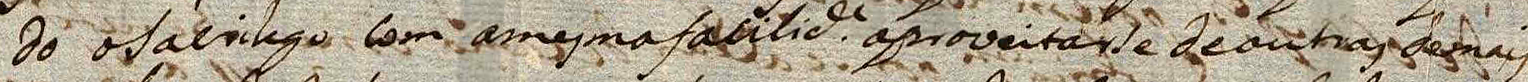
do o sacrilego com a mesma facilid.e aproveitarse de outras de mais
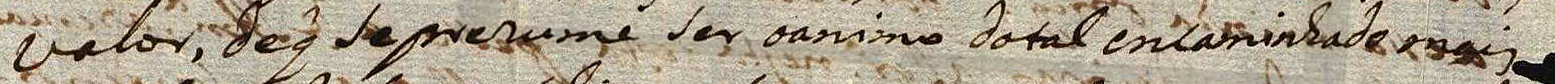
valor, de q̄ se prezume ser o animo do tal encaminhado mais
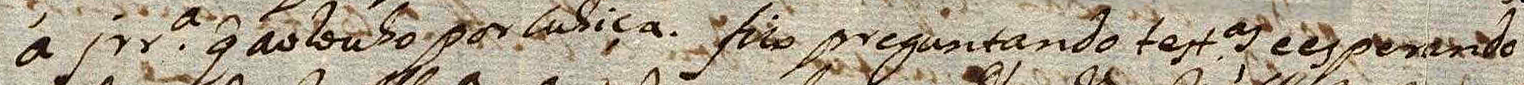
á jrr.a q̄ ao Roubo por cubiça. fico perguntando test.as, e esperando
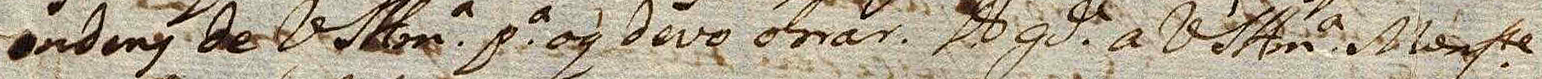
ordens de V Illm.a p.a o q̄ devo obrar. Ds gd.e a V Illm.a Monf.te
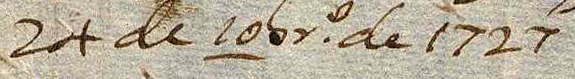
24 de 10br.o de 1727
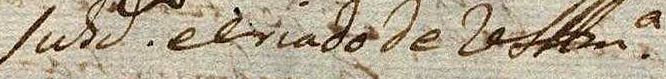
subd.to e criado de V Illm.a
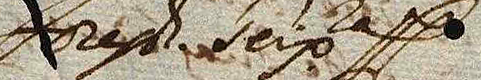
Jozeph Teix.ra
